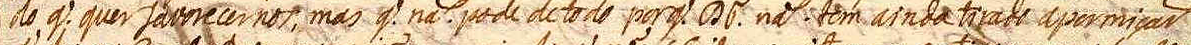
do q̄. quer favorecernos, mas q̄. naõ pode de todo porq̄ Ds̄. naõ. tem ainda tirado a permiçaõ
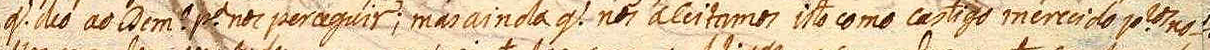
q̄. deo ao Dem.o pa nos perceguir; mas ainda q̄. nós aceitamos isto como castigo merecido p.los no
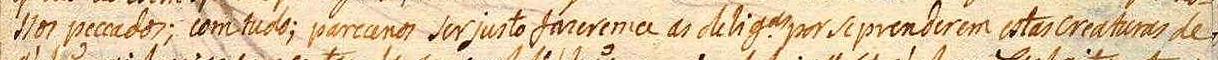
ssos peccados; comtudo; parecenos ser justo fazeremce as delig.as, por se prenderem estas creaturas de
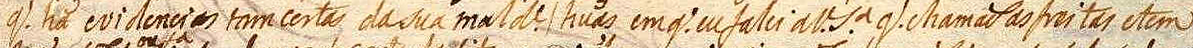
q̄. há evidencias tam certas da sua malde / huās, em q̄. eu falei a V. S.a q̄. chamaõ as freitas, e tem
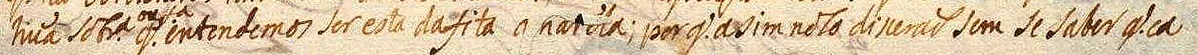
huā sobr.a ou f.a q̄. entendemos ser esta da fita q̄. haverá; porq̄ asim noLo disseraõ sem se saber q̄. ca
